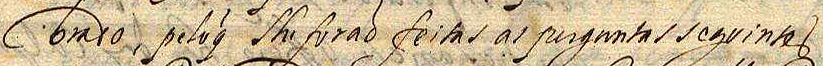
brado, pelo q̄ lhe foraõ feitas as perguntas seguintes.
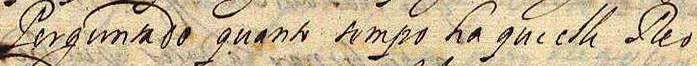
Perguntado quanto tempo ha que elle Reo
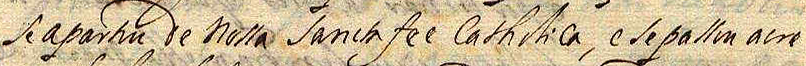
se apartou de nossa sancta fee catholica, e se passou a crē
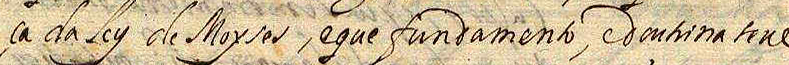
ça da ley de Moyses, e que fundamento, e doutrina teue
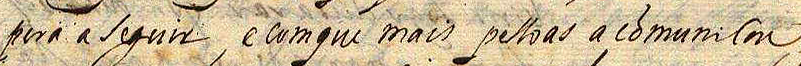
pera a seguir, e com que mais pessoas a cōmunicou,
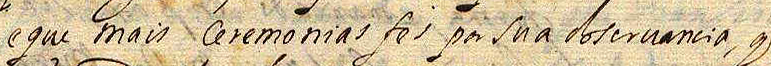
e que mais ceremonias foi por sua obseruancia, q̄
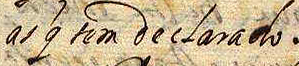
as q̄ tem declarado.
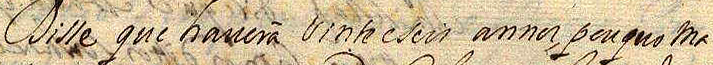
Disse que hauerá vinte e seis annos, pouquo ma
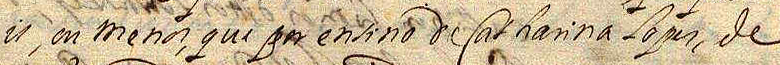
is, ou menos, que por ensino de Catharina lopes, de
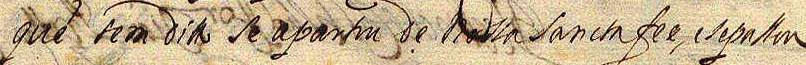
quē tem ditto se apartou de nossa sancta fee, e se passou
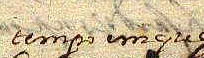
tempo em que
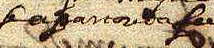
se apartou da fee
